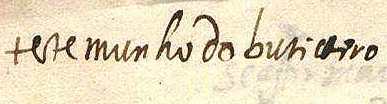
testemunho do buticairo
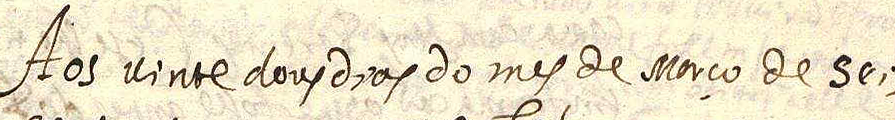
Aos uinte dous dias do mes de Março de seis
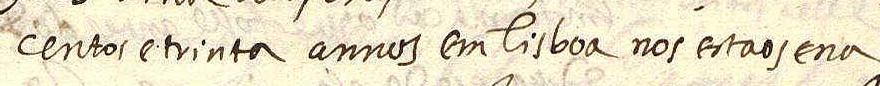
centos e trinta annos em lisboa nos estaos e na
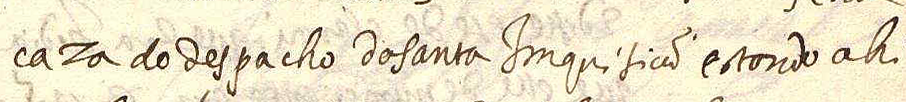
caza do despacho da santa Imquisiçaõ estando ahi
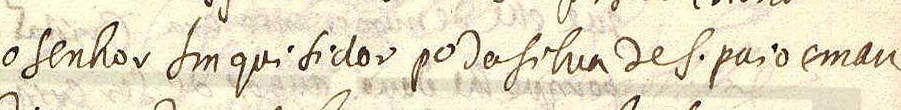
o senhor Imquisidor po da silua de s. paio em au
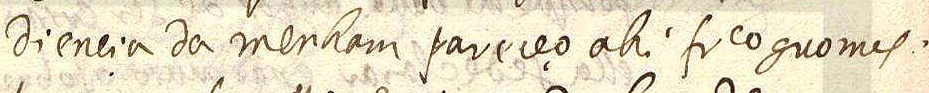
diencia da menham pareceo ali frco guomes
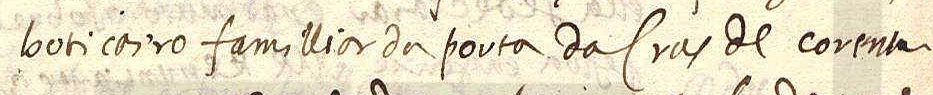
boticairo familliar da porta da Crus de corenta
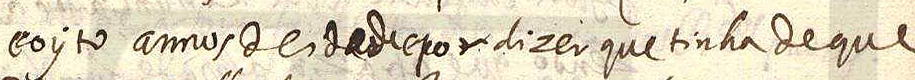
e oyto annos de idade e por dizer que tinha de que
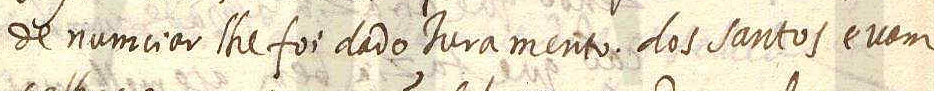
denunciar lhe foi dado Iuramento dos santos euam
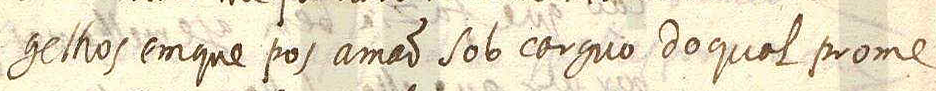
gelhos em que pos a maõ sob carguo do qual prome
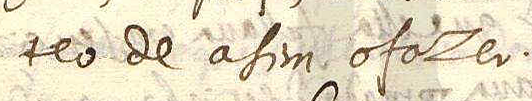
teo de asim o fazer.
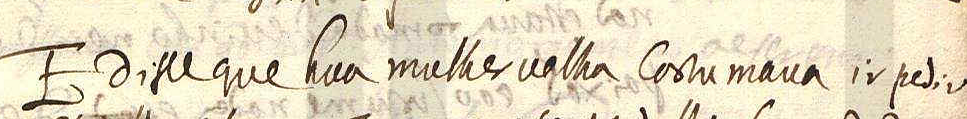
E disse que hua mulher uelha costumaua ir pedir
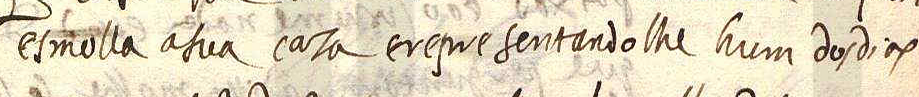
esmolla a sua caza e representandolhe hum dos dias
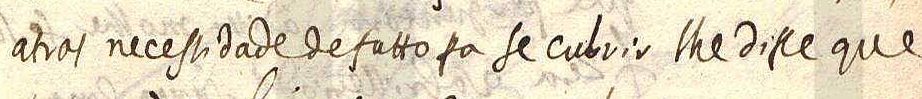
atras necessidade de fatto pa se cubrir lhe disse que
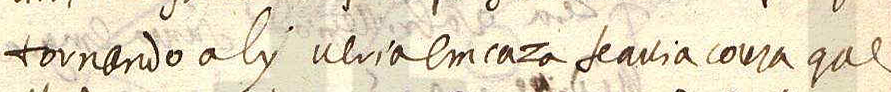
tornando aly ueria em caza se auia couza que
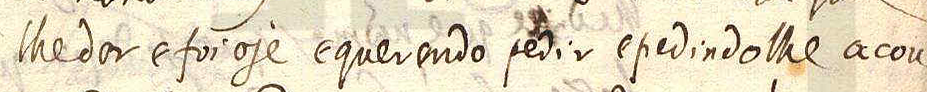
lhe dar e foi oje e querendo pedir e pedindolhe a cou
